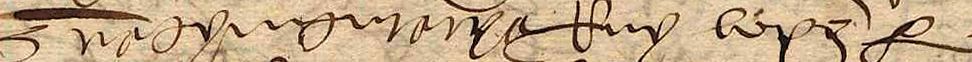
item na tymtutarya Ruy lopez ho
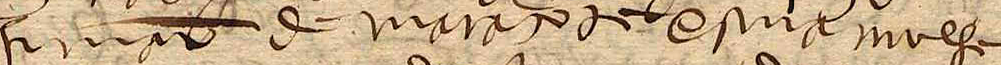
Jrmão de maracote e sua molher
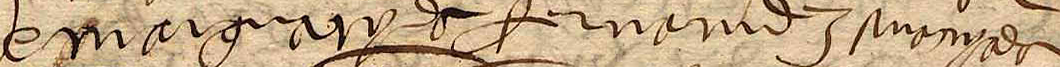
e marguaryda fernamdez sua cryada
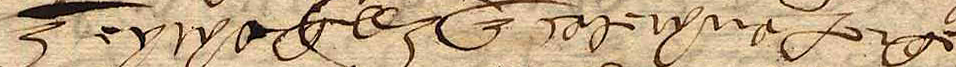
item eyrya ḡllz item cateryna Jorge
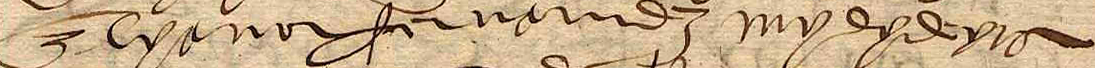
item lyanor fernamdez mydydeyra
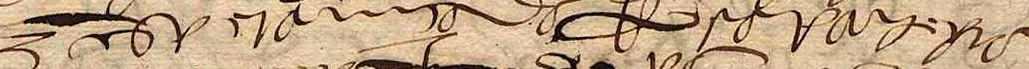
item esperamca da Rosa parteyra
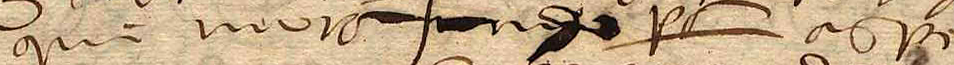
que mora Jumto ꝑa as pe
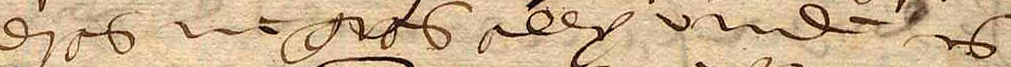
dras negras ally onde es
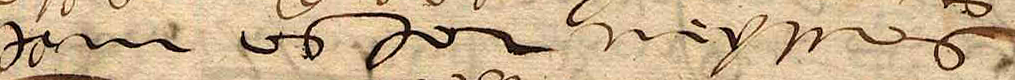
tam os torneyrros
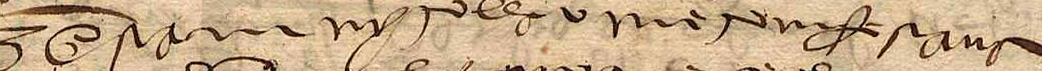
item ē sam nycollao me comfesaua
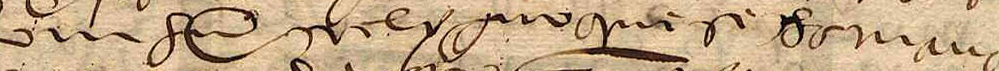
com hū crelyguo que se chamaua
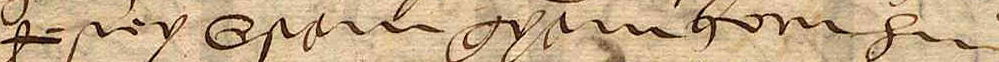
fesey ē sam gyam com hū
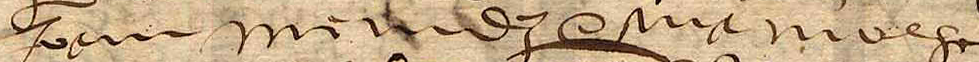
Joam memdez e sua molher
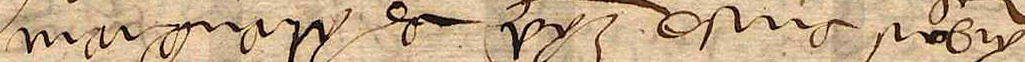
marguaryda p̄yz e sua sobry
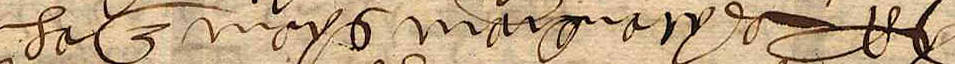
nha item mays marguaryda Ry
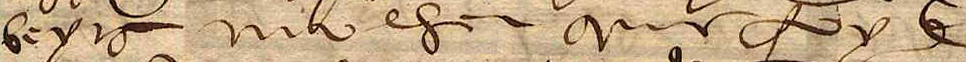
beyra molher que foy de
